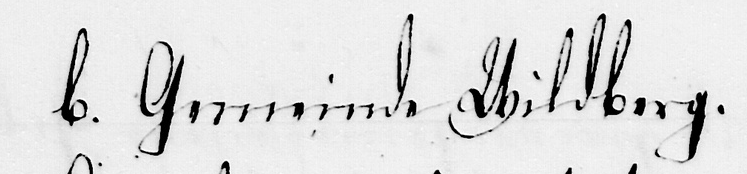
b. Gemeinde Wildberg.
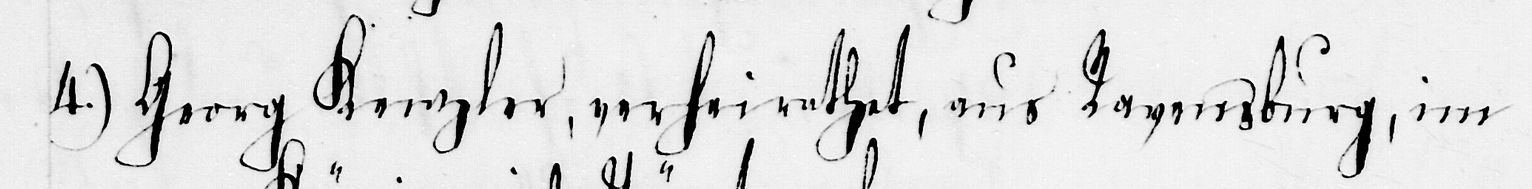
4.) Georg Kenzler, verheirathet, aus Ravensburg, im
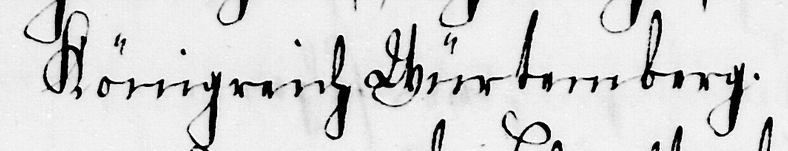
Königreich Würtemberg.
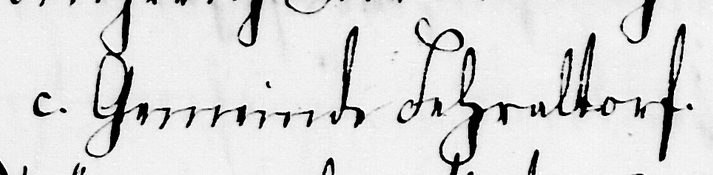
c. Gemeinde Fehraltorf.
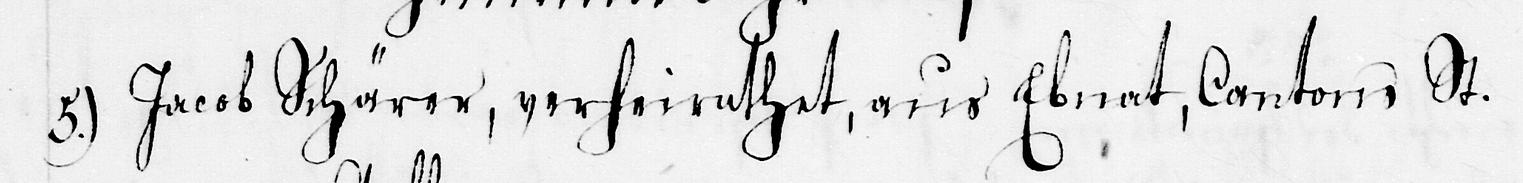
5.) Jacob Schärer, verheirathet, aus Ebnat, Cantons St.
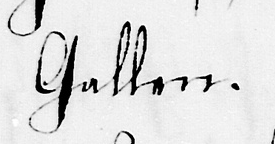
Gallen.
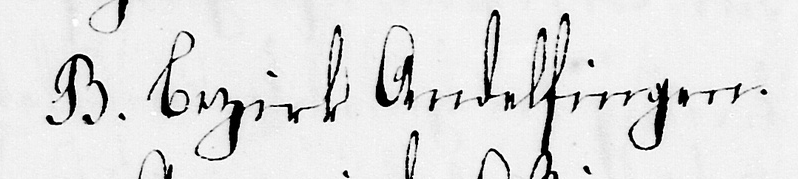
B. Bezirk Andelfingen.
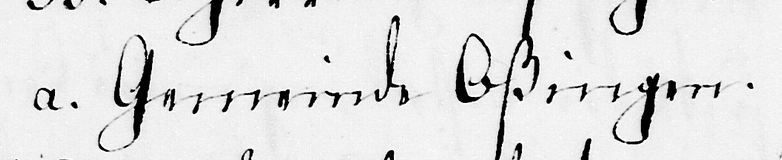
a. Gemeinde Oßingen.
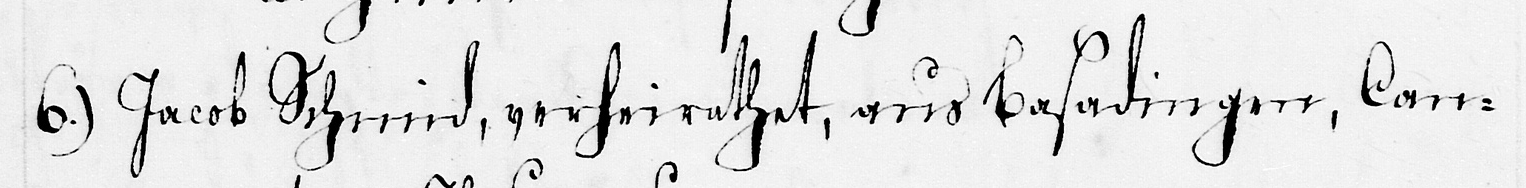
6.) Jacob Schmid, verheirathet, aus Basadingen, Can¬
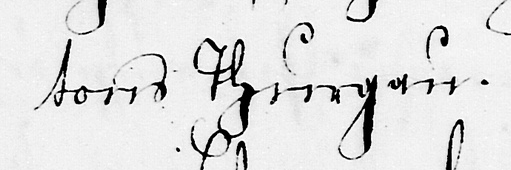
tons Thurgau.
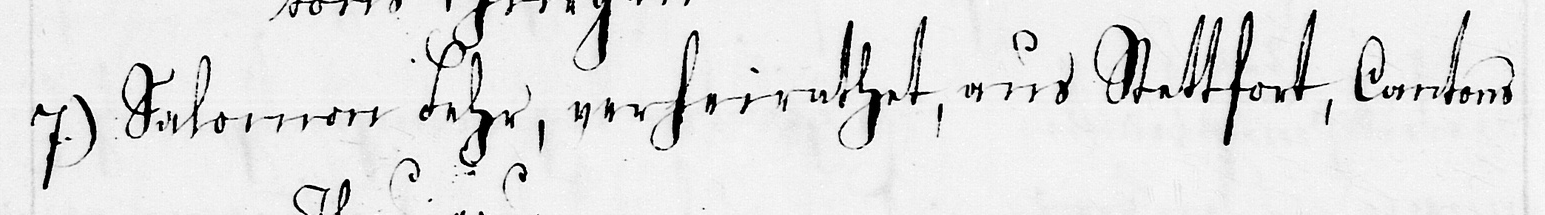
7.) Salomon Fehr, verheirathet, aus Stettfort, Cantons
